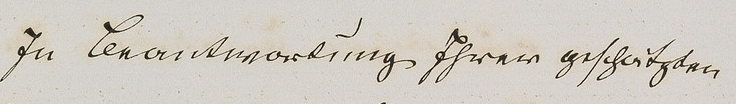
In Beantwortung Ihrer geschätzten
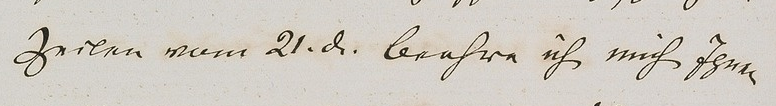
Zeilen vom 21.d. beehre ich mich Ihnen
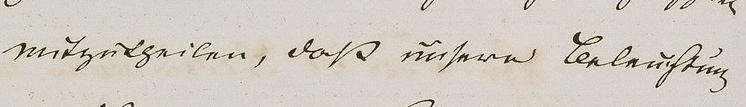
mitzutheilen, daß nähere Beleuchtung
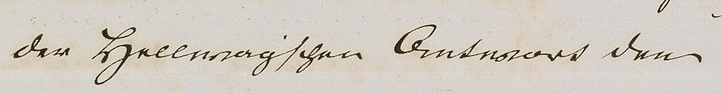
der Hellwag'schen Antwort den
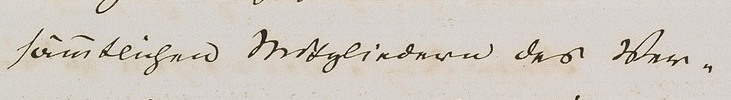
sämmtlichen Mitgliedern des Ver-
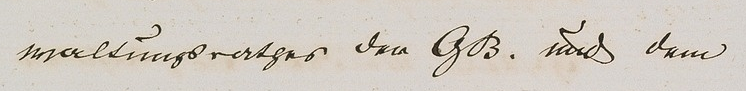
waltungsrathes der GB. und dem
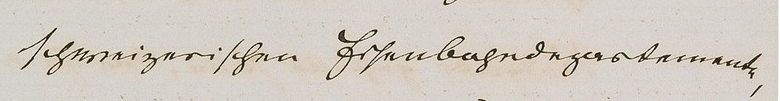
schweizerischen Eisenbahndepartemente,
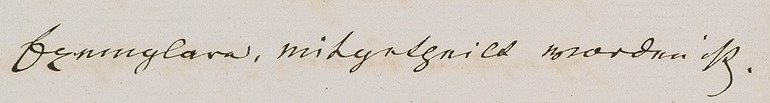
Exemplare, mitgetheilt worden ist.
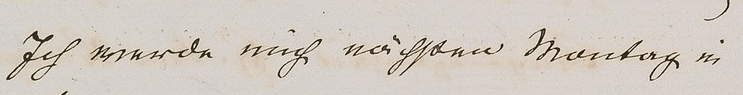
Ich werde mich nächsten Montag in
